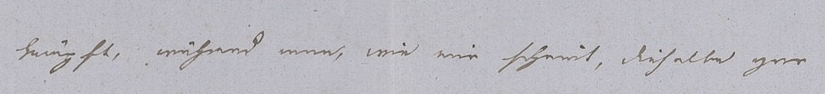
kämpft, während man, wie mir scheint, dieselbe gar
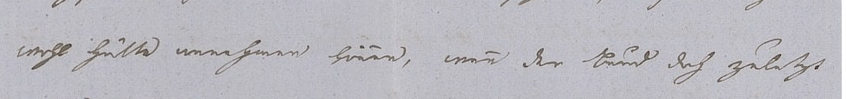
wohl hätte annehmen können, wenn der Bund doch zuletzt
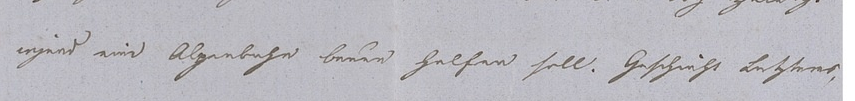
irgend eine Alpenbahn bauen helfen soll. Geschieht Letzteres,
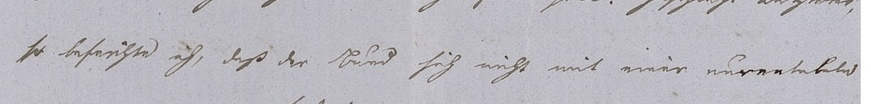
so befürchte ich, daß der Bund sich nicht mit einer unrentabeln
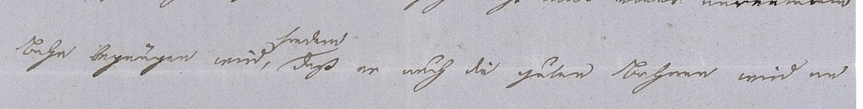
Bahn begnügen wird, sondern daß er auch die guten Bahnen wird an
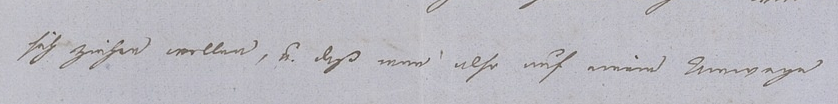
sich ziehen wollen, u. daß man also auf einem Umwege
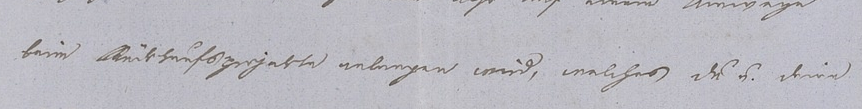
beim Rückkaufsprojekte anlangen wird, welches Du u. Deine
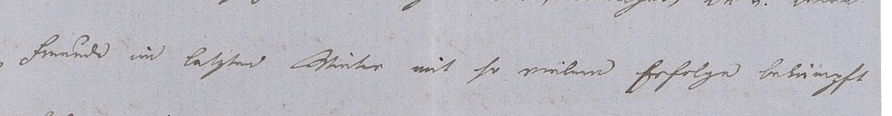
Freunde im letzten Winter mit so vielem Erfolge bekämpft
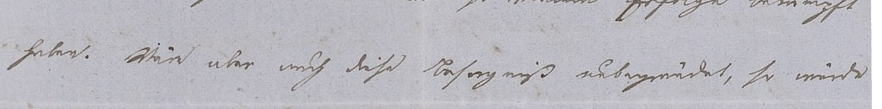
haben. Wäre aber auch diese Besorgniß unbegründet, so würde
